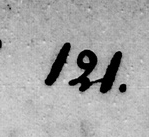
1838.
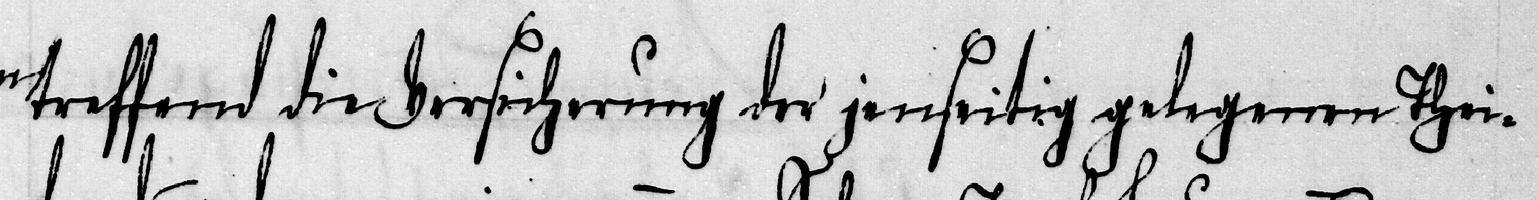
treffend die Versicherung der jenseitig gelegenen Thei¬
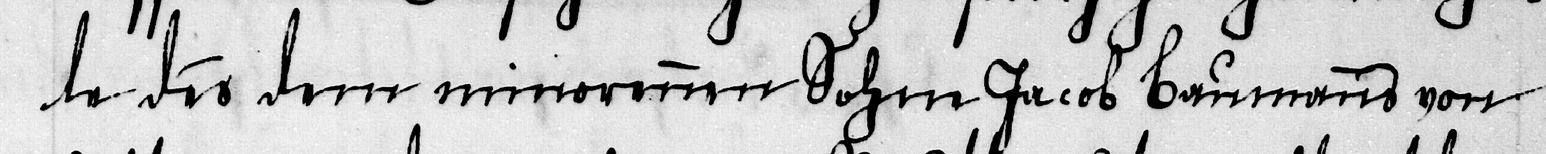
le des dem minorennen Sohne Jacob Baumanns von
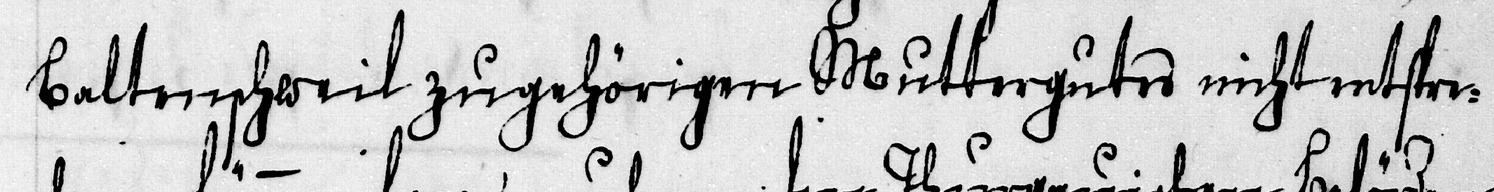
Baltenschweil zugehörigen Muttergutes nicht entspre¬
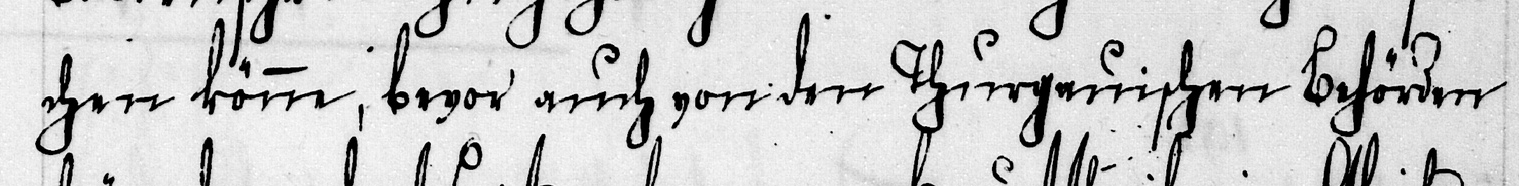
chen könne, bevor auch von den Thurgauischen Behörden
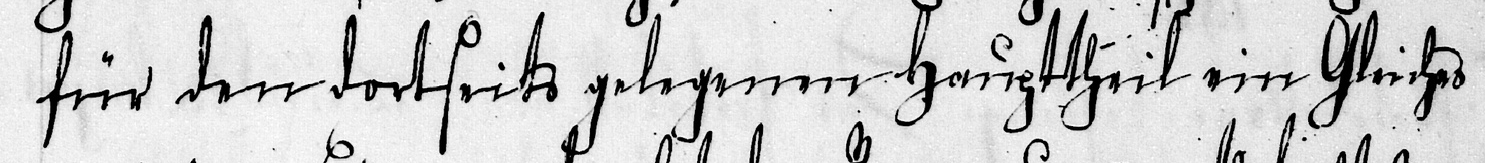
für den dortseits gelegenen Haupttheil ein Gleiches
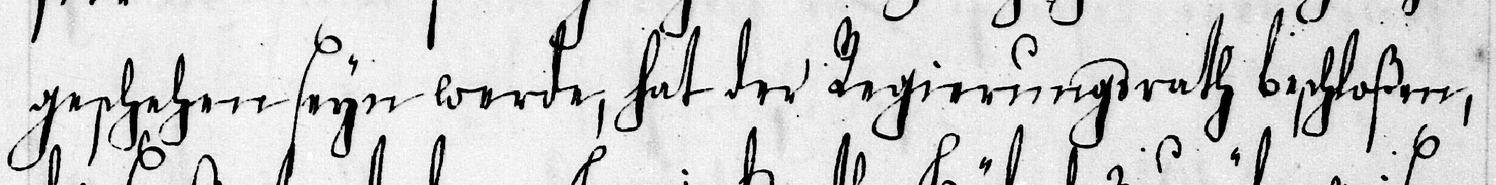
geschehen seyn werde, hat der Regierungsrath beschloßen,
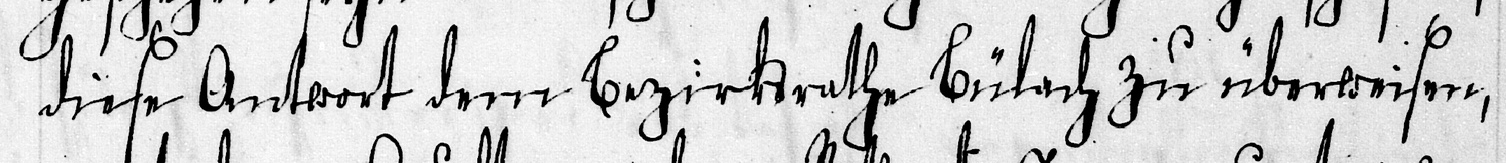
diese Antwort dem Bezirksrathe Bülach zu überweisen,
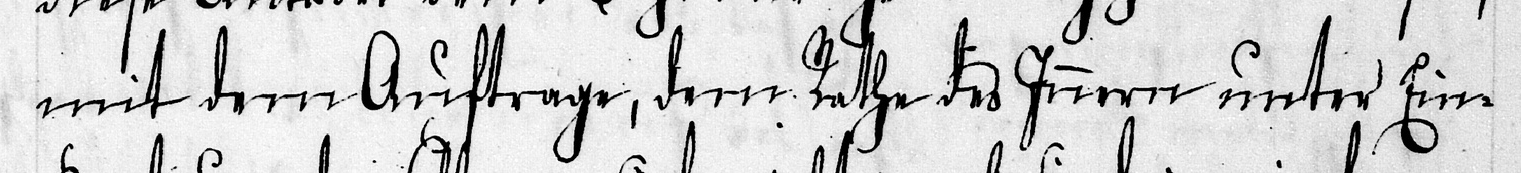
mit dem Auftrage, dem Rathe des Innern unter Ein¬
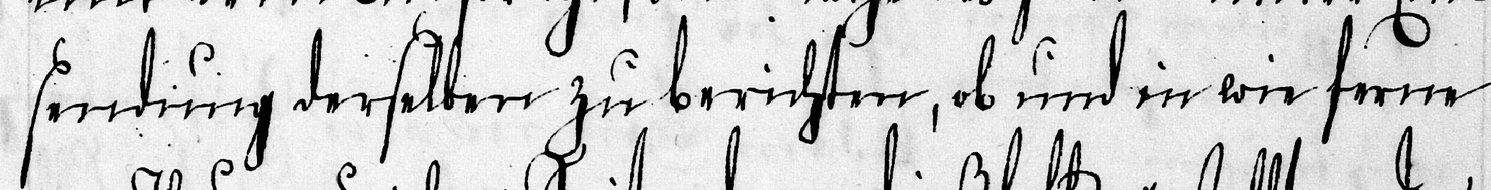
sendung derselben zu berichten, ob und in wie ferne
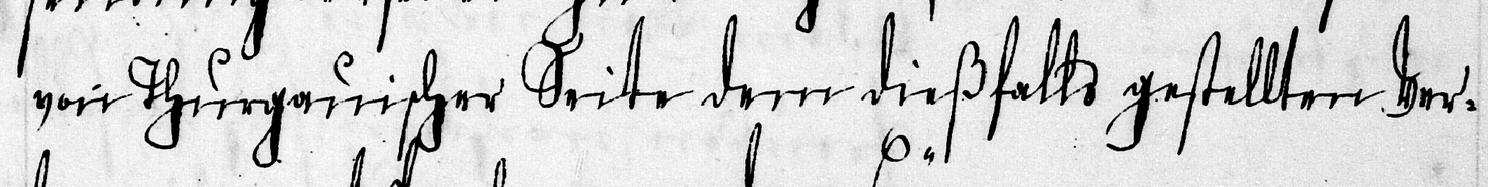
von Thurgauischer Seite dem dießfalls gestellten Ver¬
